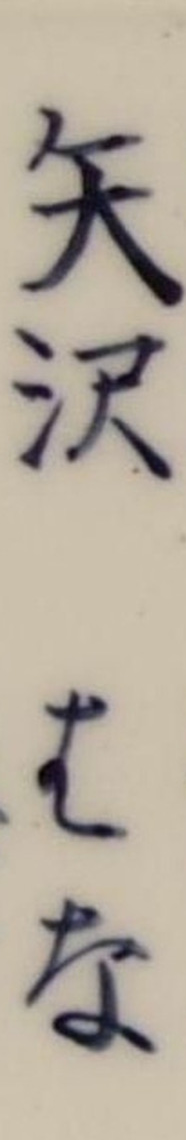矢沢はな

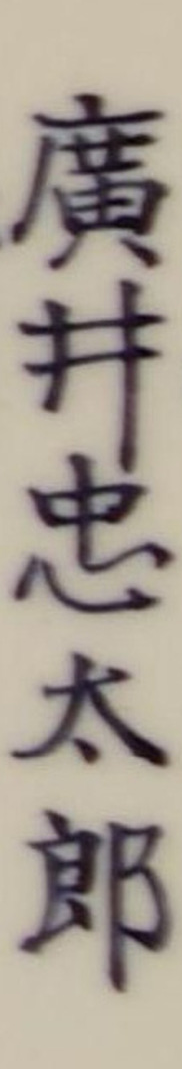廣井忠太郎
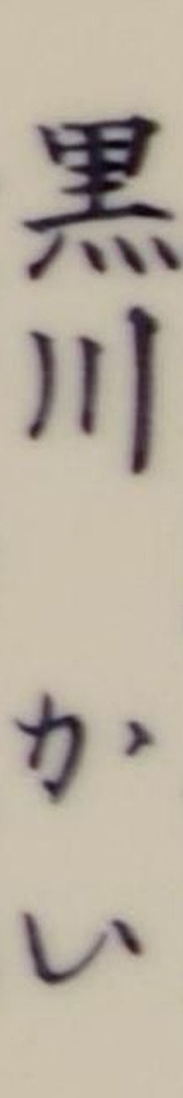黒川かい
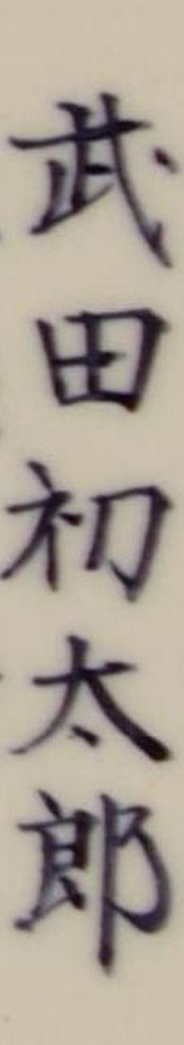武田初太郎
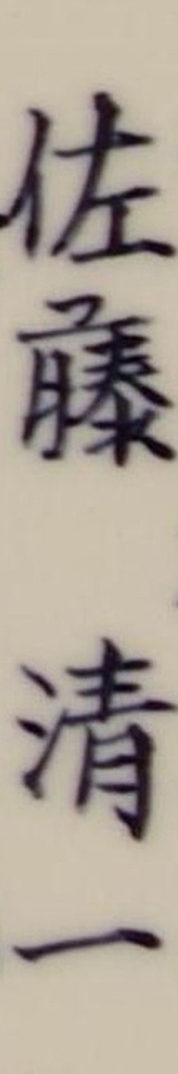佐藤清一
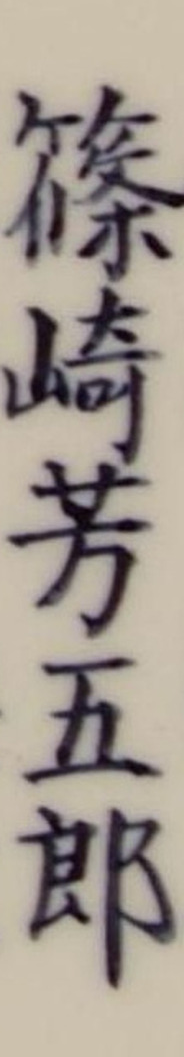篠崎芳五郎
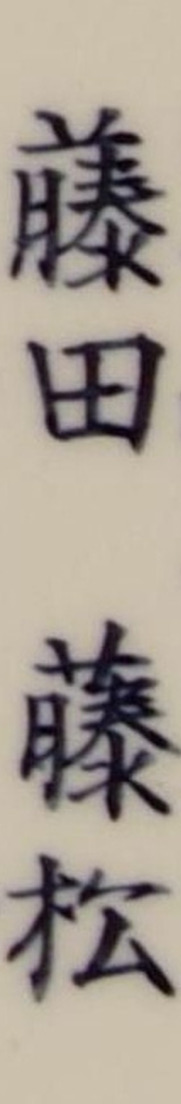藤田藤松
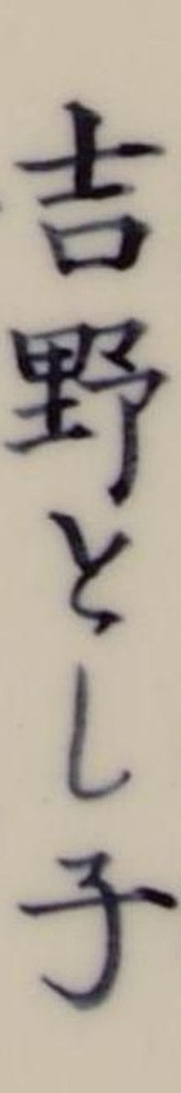吉野とし子
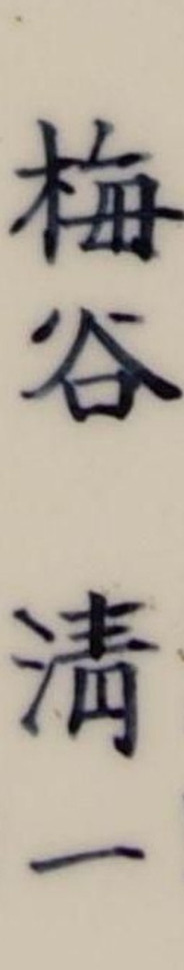梅谷清一
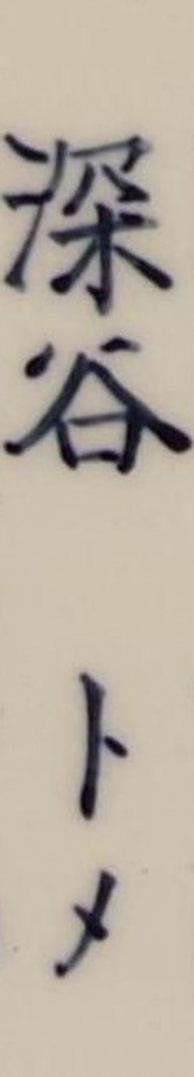深谷トメ
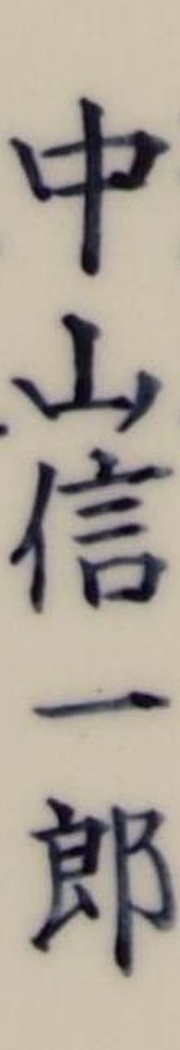中山信一郎
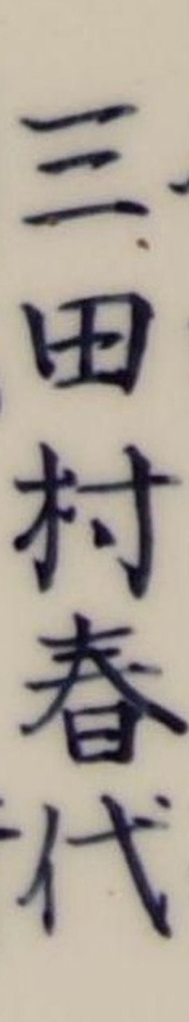三田村春代
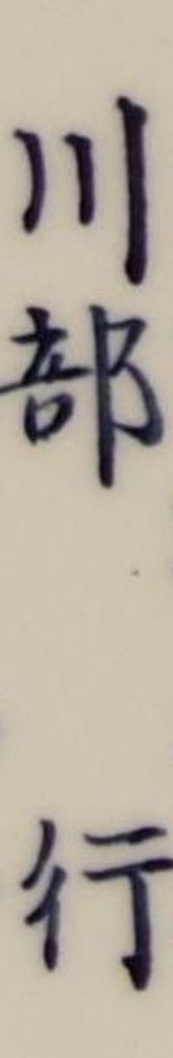川部行

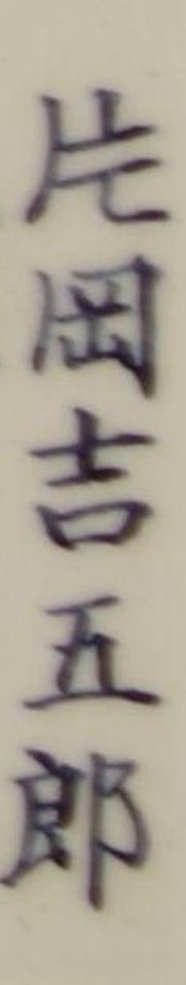片岡吉五郎
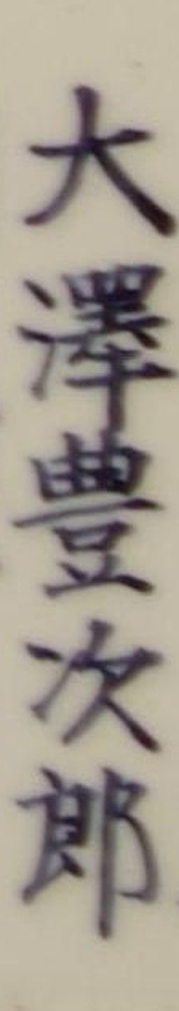大澤豊次郎
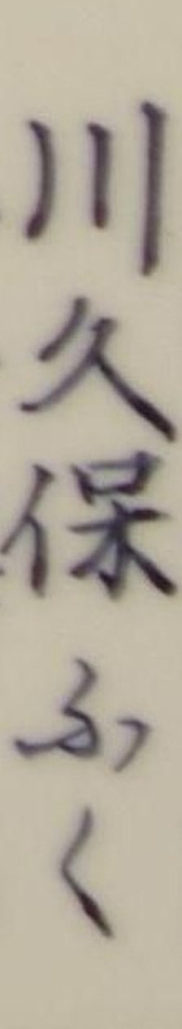川久保ふく
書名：E~L
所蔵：高野山金剛峯寺
